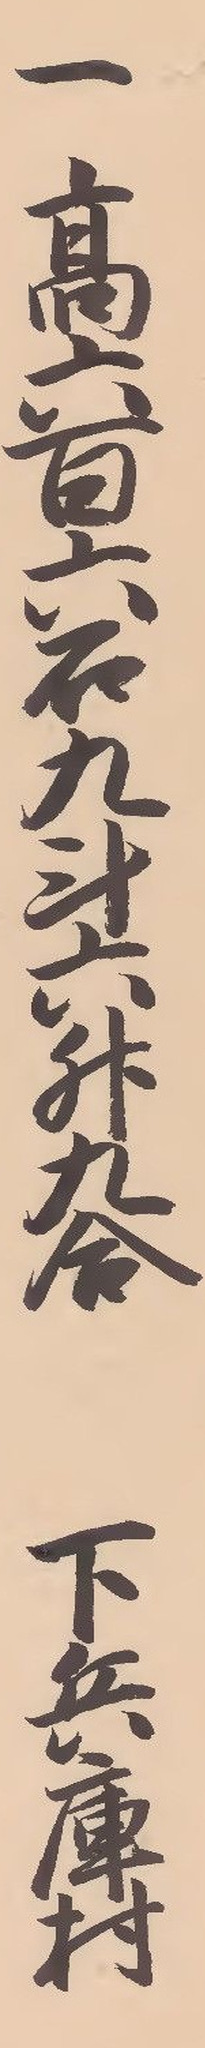一高六百六石九斗六升九合下兵庫村
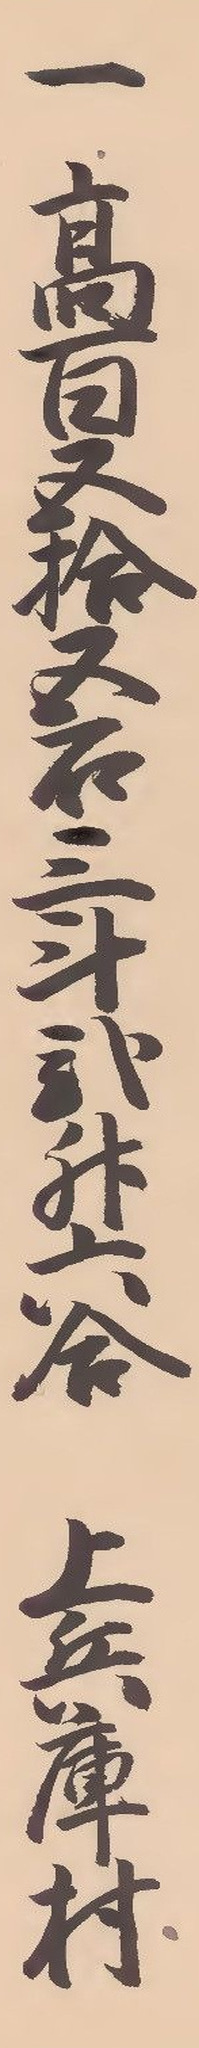一高百五拾五石三斗弐升六合上兵庫村
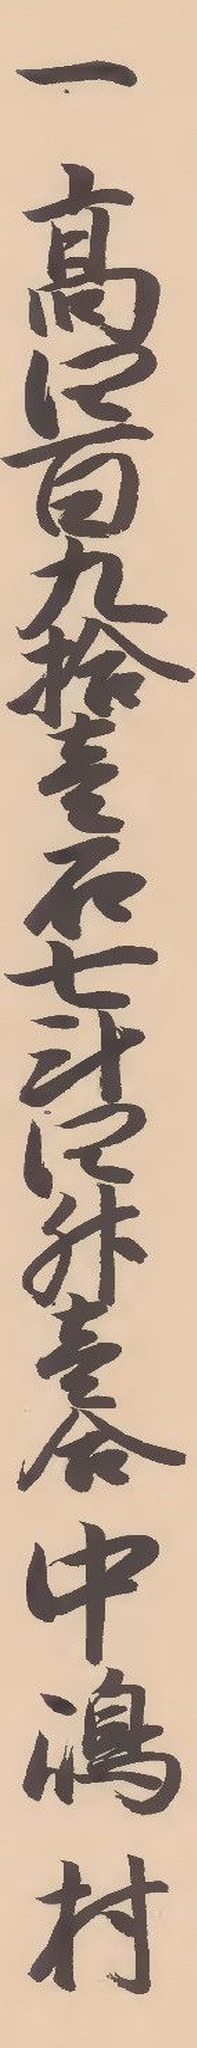一高四百九拾壱石七斗四升壱合中島村
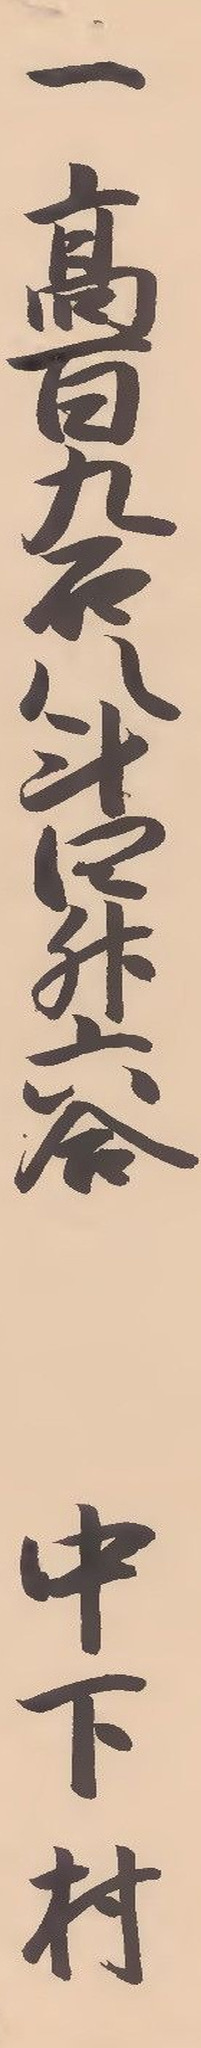一高百九石八斗四升六合中下村
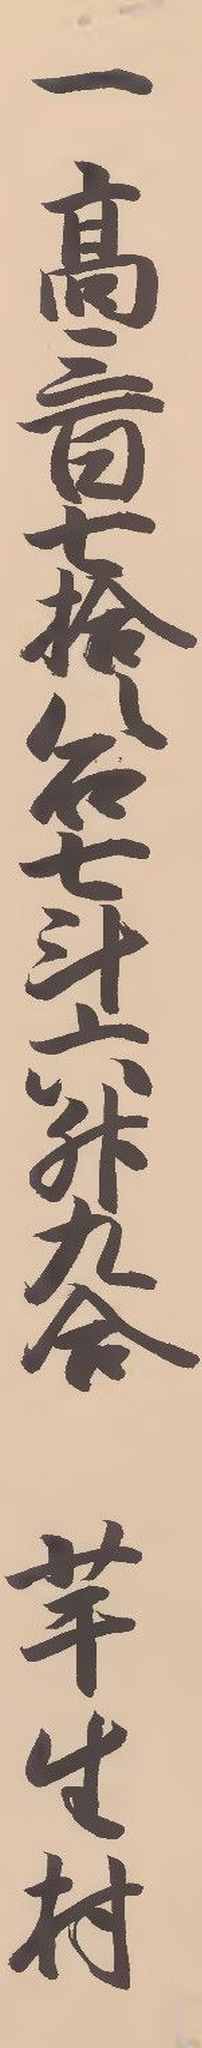一高三百七拾八石七斗六升九合芋生村
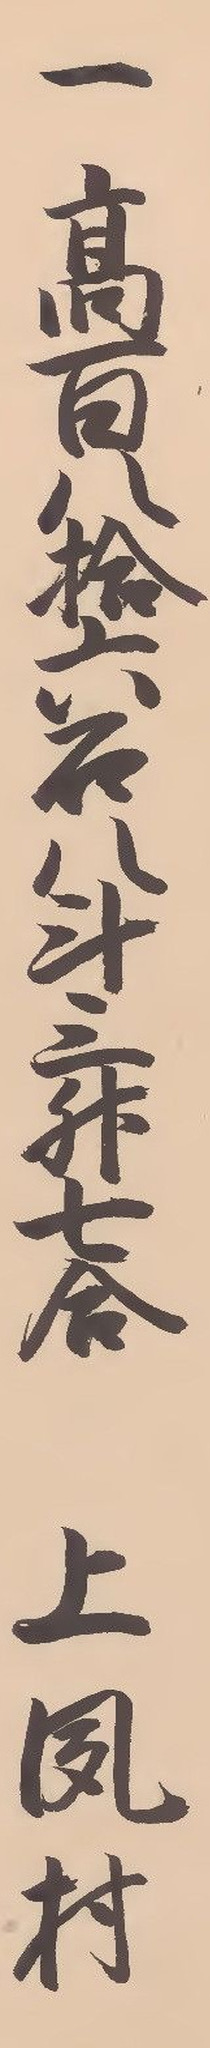一高百八拾六石八斗三升七合上夙村
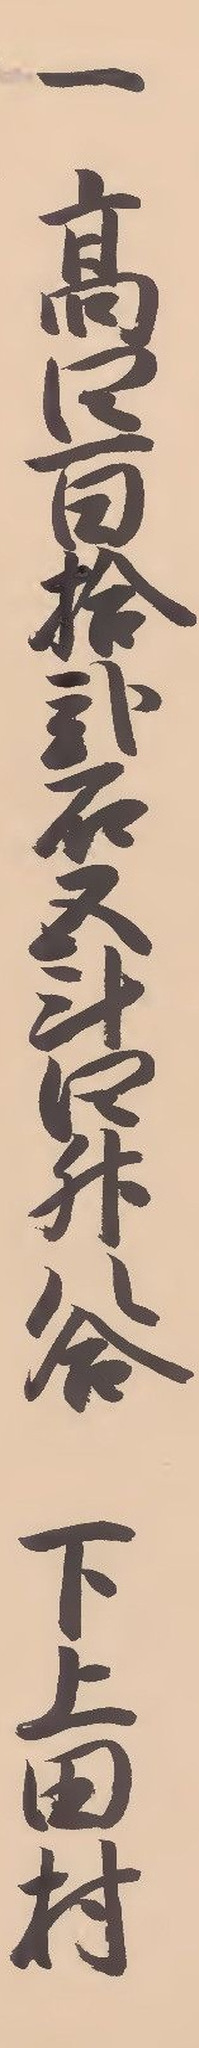一高四百拾弐石五斗四升八合下上田村

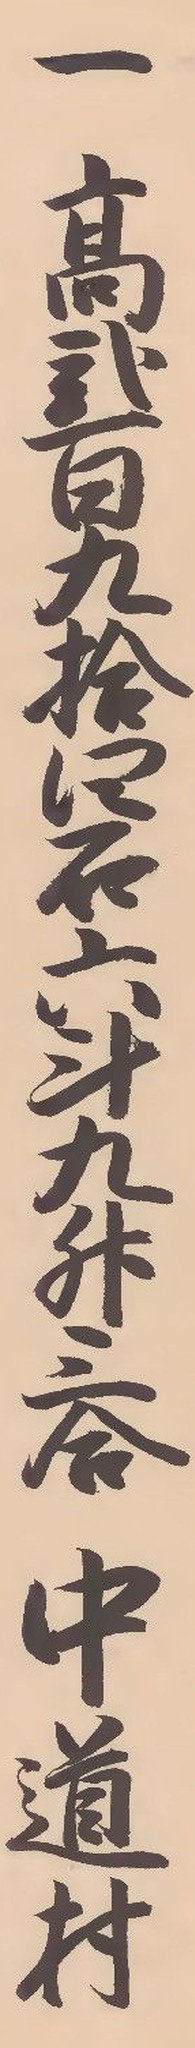一高弐百九拾四石六斗九升三合中道村
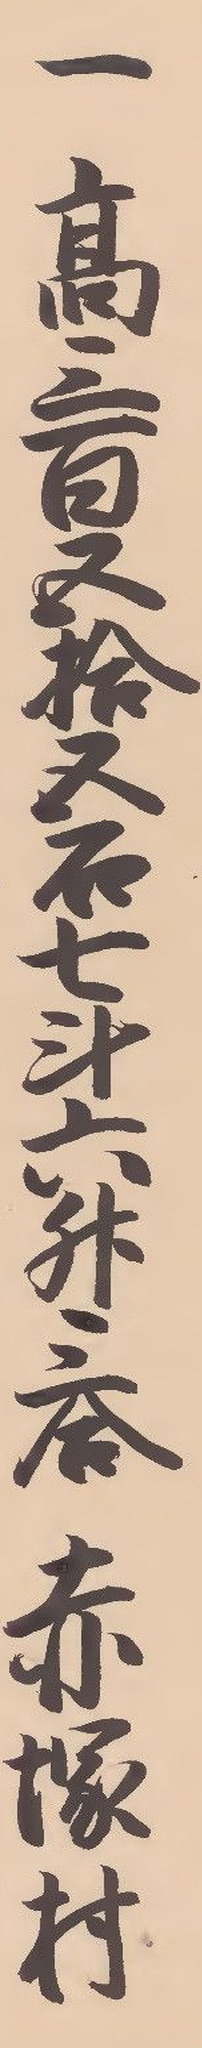一高三百五拾五石七斗六升三合赤塚村
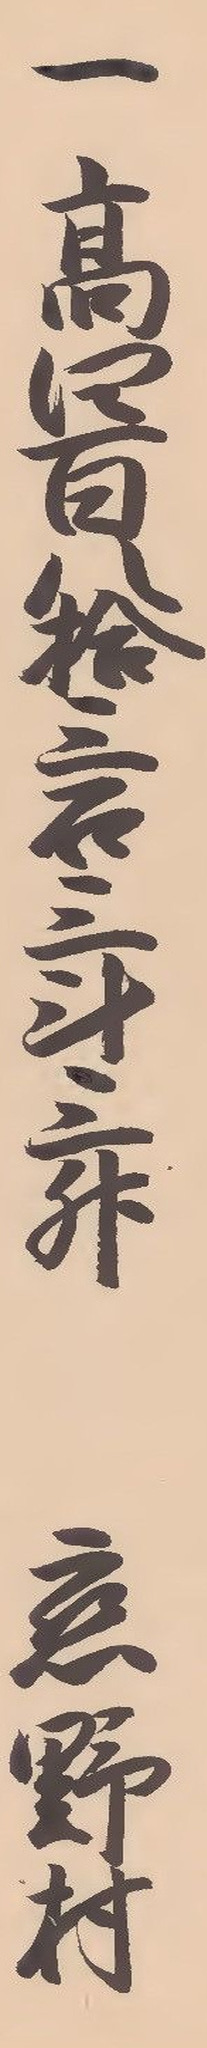一高四百八拾三石三斗三升恋野村
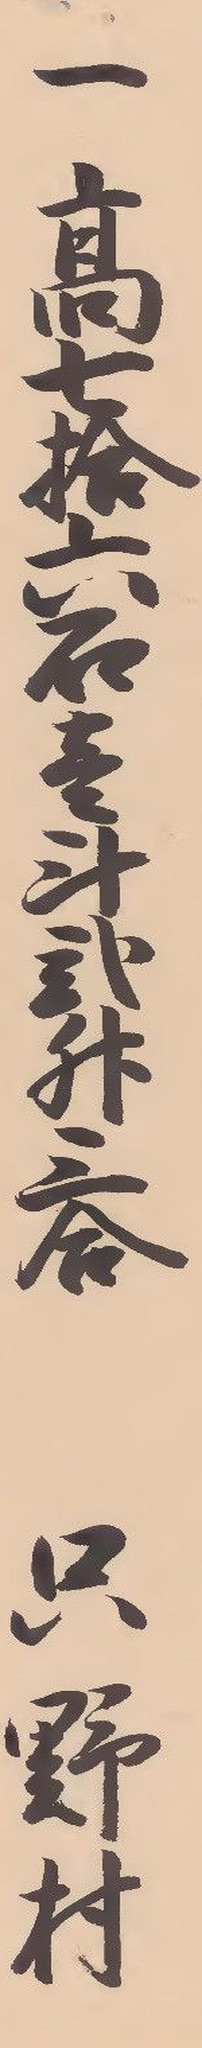一高七拾六石壱斗弐升三合只野村
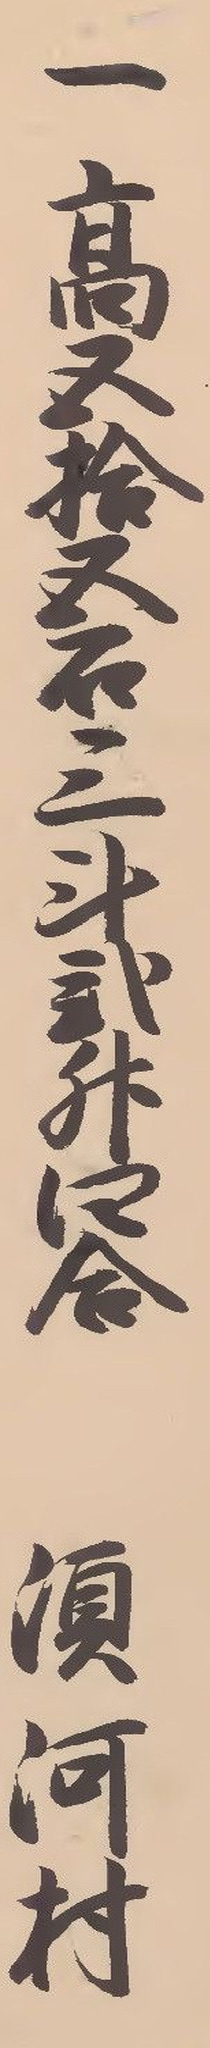一高五拾五石三斗弐升四合須河村
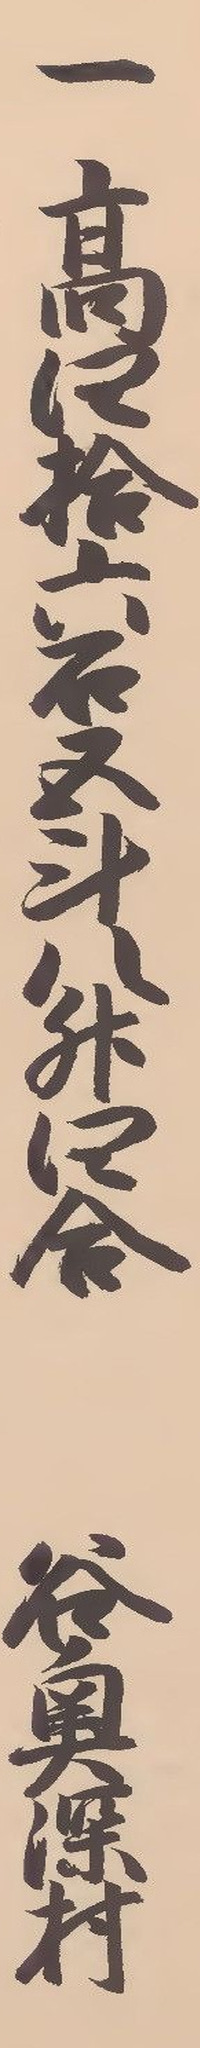一高四拾六石五斗八升四合谷奥深村
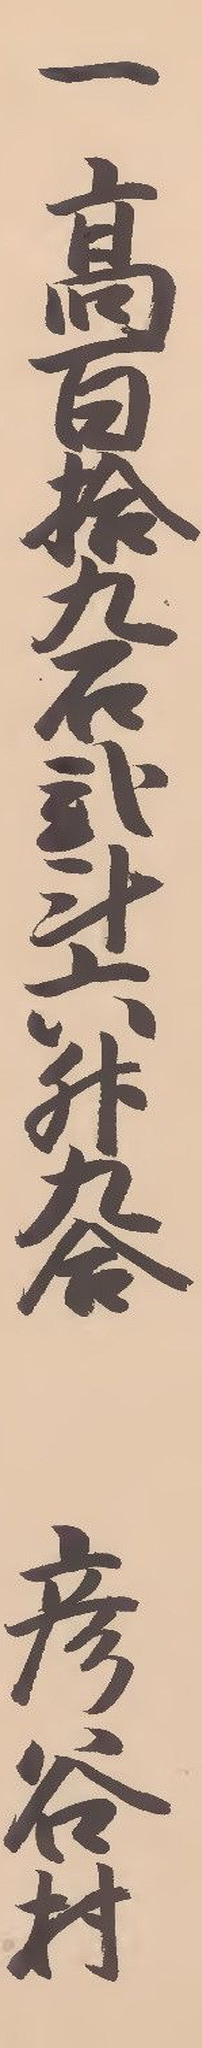一高百拾九石弐斗六升九合彦谷村
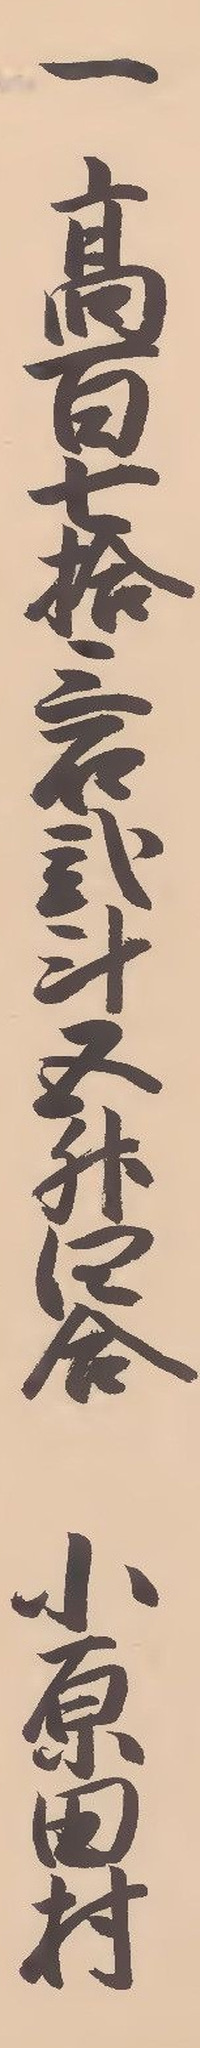一高百七拾三石弐斗五升四合小原田村

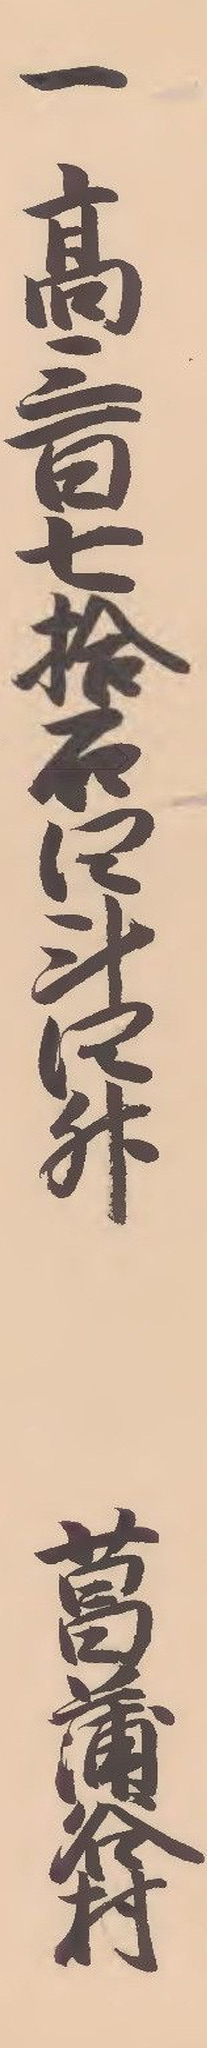一高三百七拾石四斗四升菖蒲谷村
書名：紀伊国郷帳
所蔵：国立公文書館 National Archives of Japan
